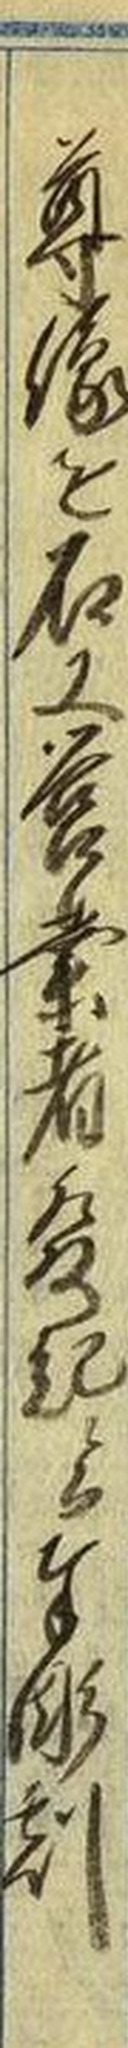尊像を石工営業者発起に而奉彫刻
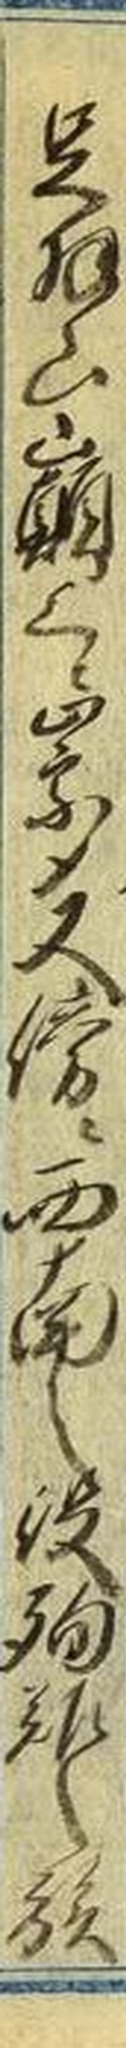足羽山巓上に崇め又傍に西南之役殉難之族
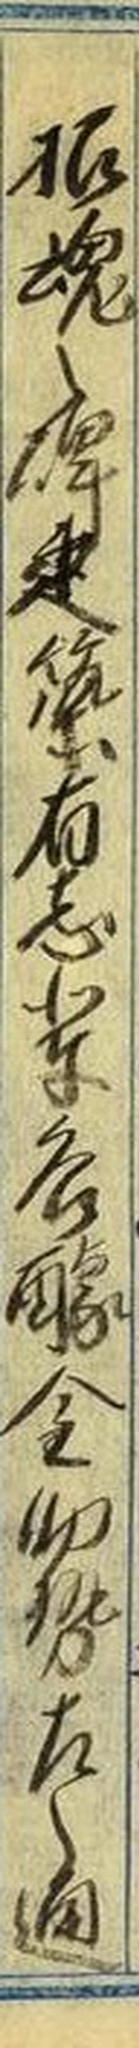招魂之碑建築有志輩各醵金助勢左之通
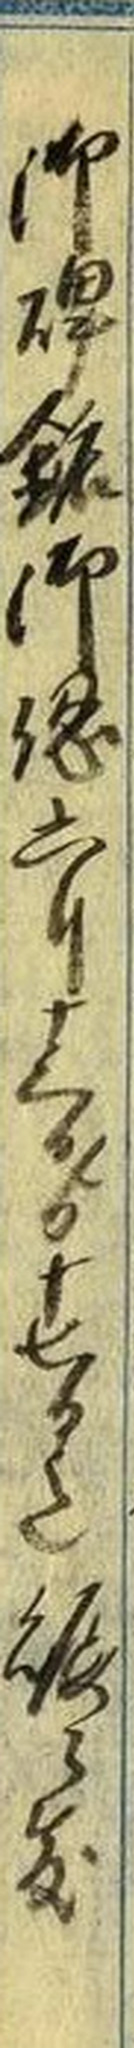御碑銘御認六月十三日ゟ十七日迄賑々敷
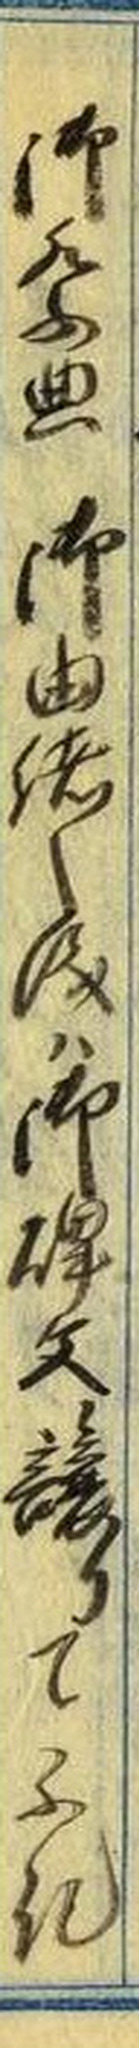御祭典御由緒之儀は御碑文に譲りて不記
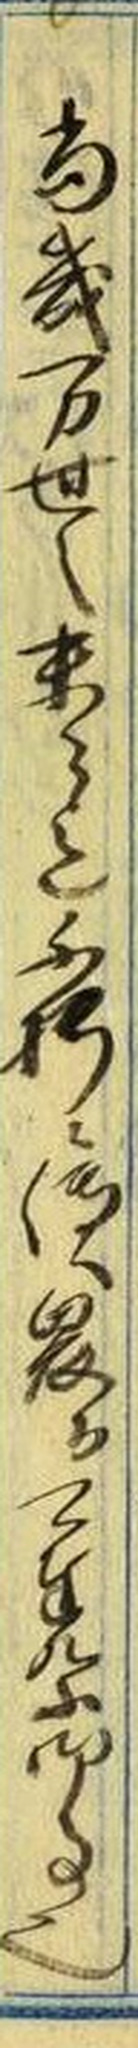尚幾万世之末々迄不朽に伝へ畏而可奉祭御事也
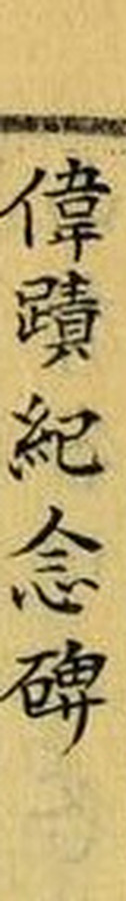偉蹟紀念碑
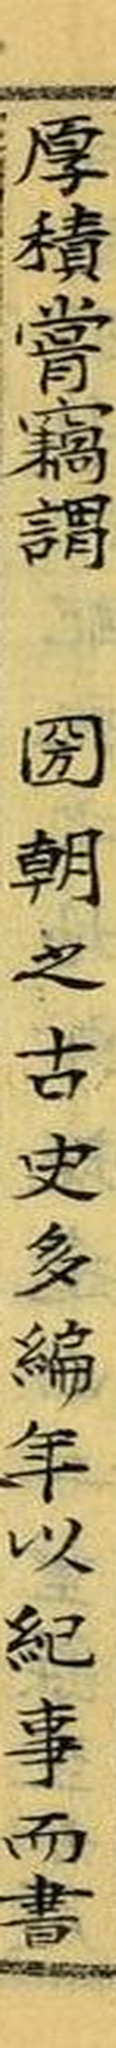厚積嘗竊謂圀朝之古史多編年以紀事而書
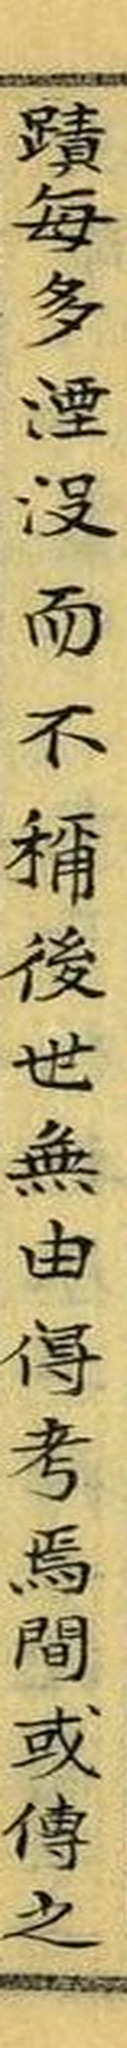蹟毎多湮没而不稱後世無由得考焉間或傳之
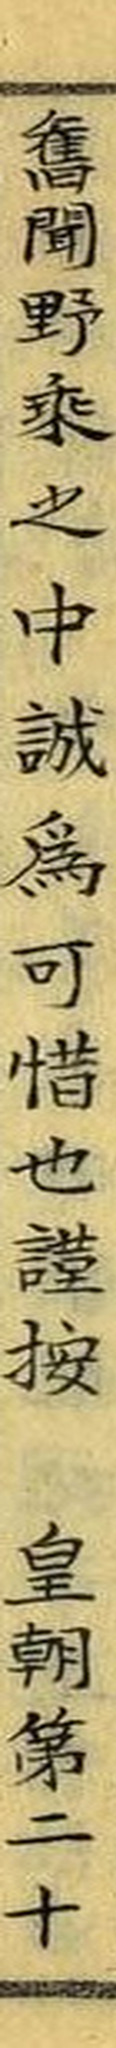舊聞野乘之中誠爲可惜也謹按皇朝第二十
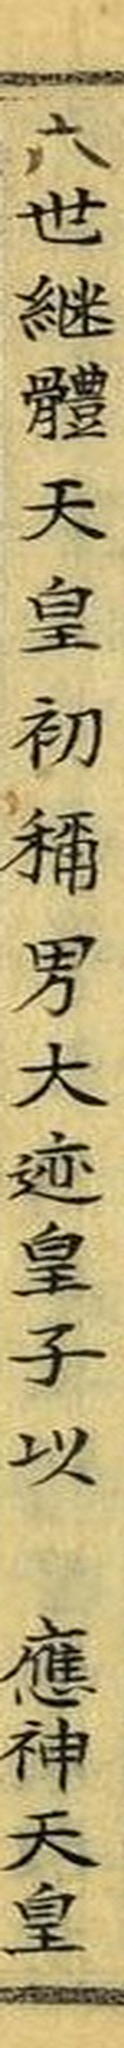六世継體天皇初稱男大迹皇子以應神天皇
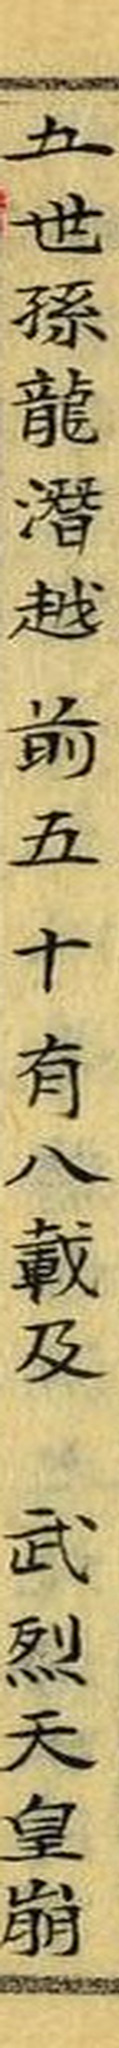五世孫龍潛越前五十有八載及武烈天皇崩
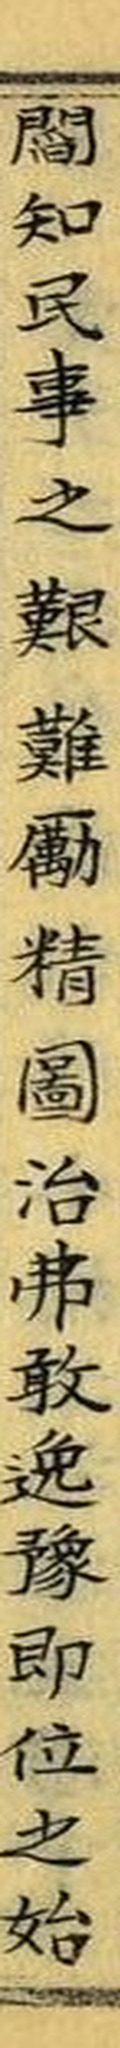𨵻知民事之艱難勵精圖治弗敢逸豫即位之始
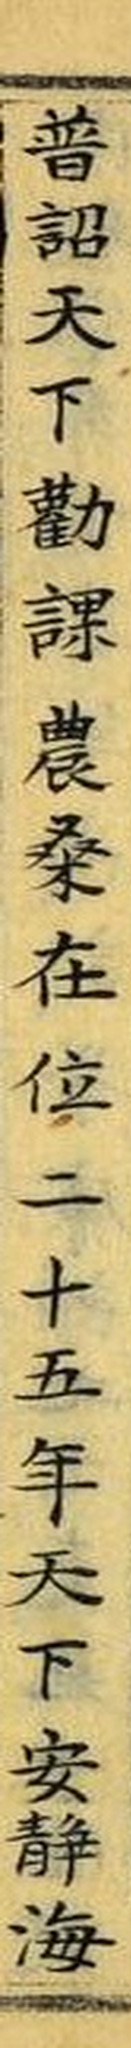普詔天下勸課農桑在位二十五年天下安静海

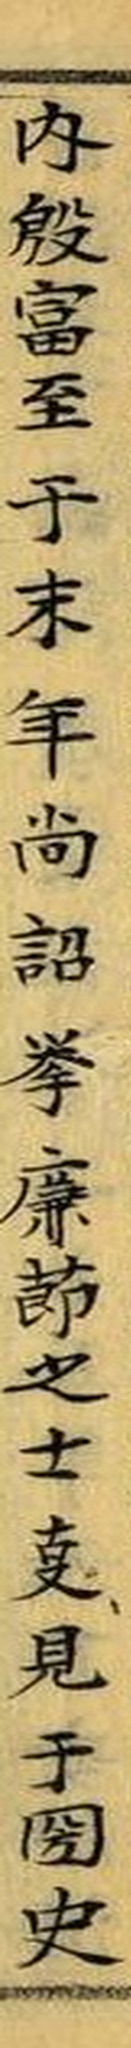内殷富至于末年尙詔挙廉莭之士叓見于圀史
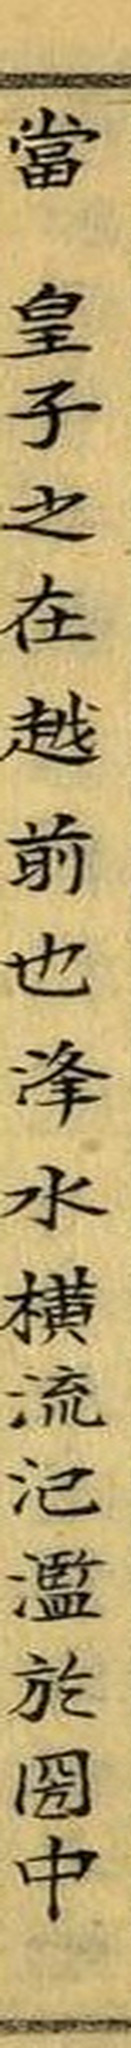當皇子之在越前也洚水横流氾濫於圀中
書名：温古集 五巻
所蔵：福井県文書館 Fukui Prefectural Archives
